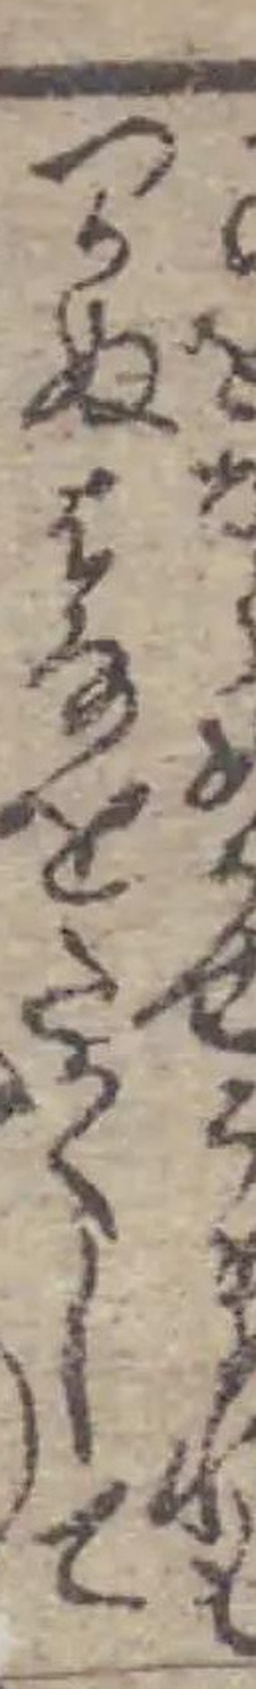つかぬはなをたかくして
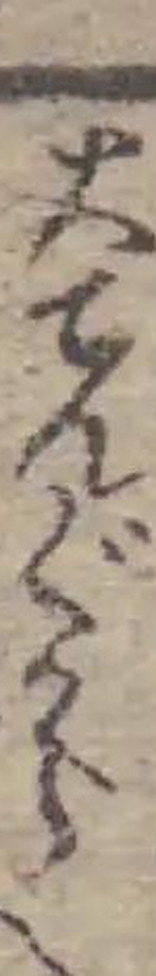大てんぐから
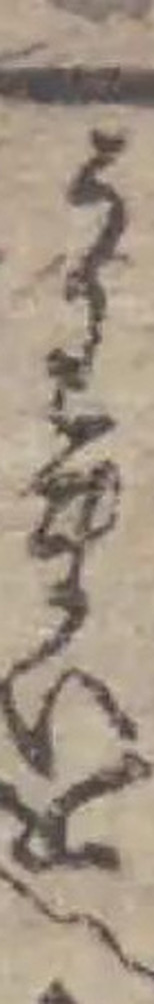うわまいを
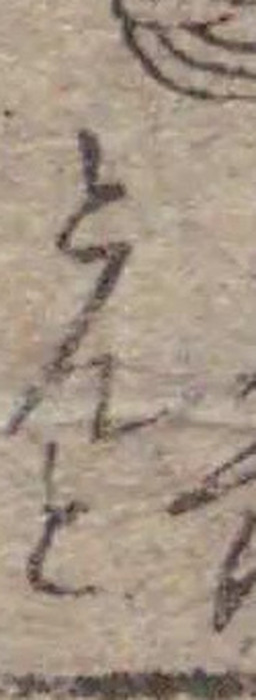とんと
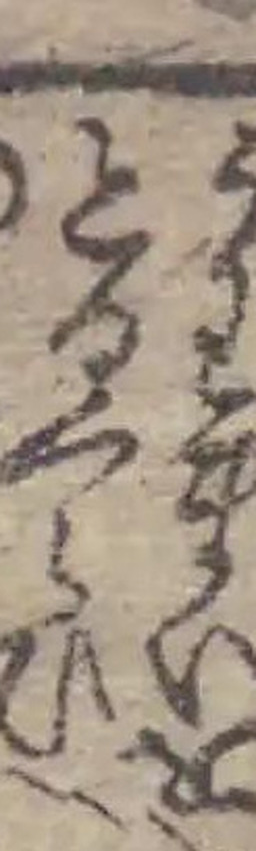とるくらひ
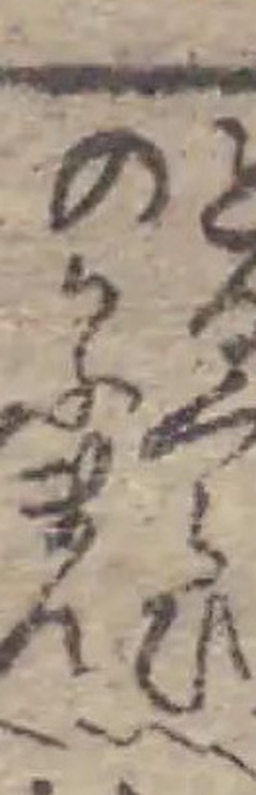のかふまん
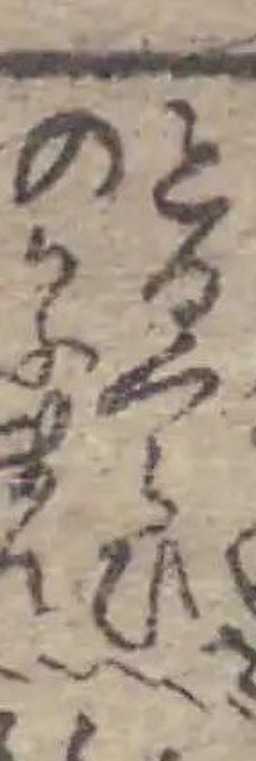のかふまん
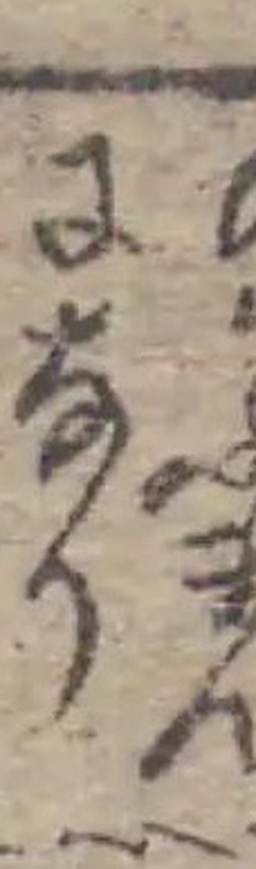になり
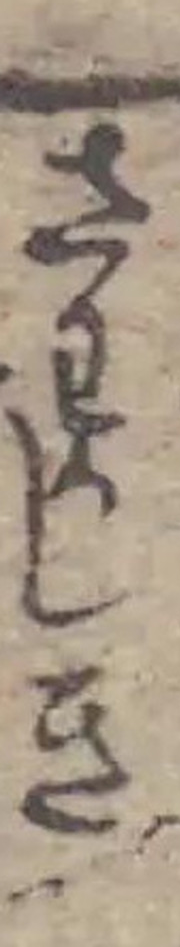さわかしき
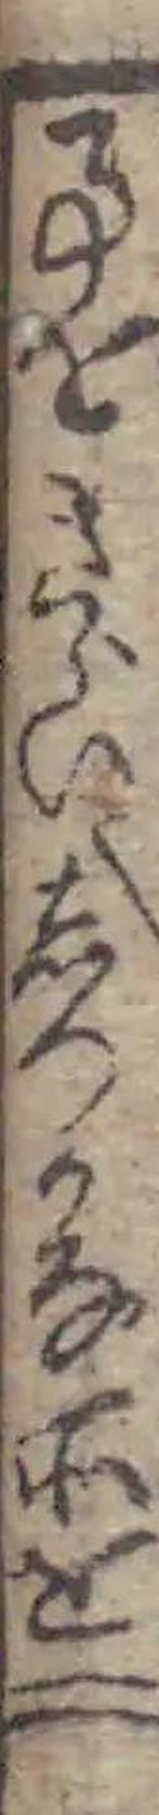事をきらいしつかな所を
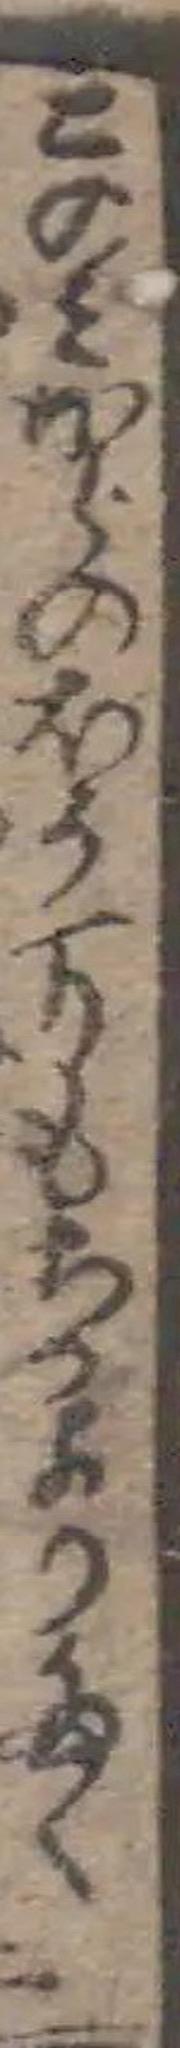このみからのほうにもちかよりたく
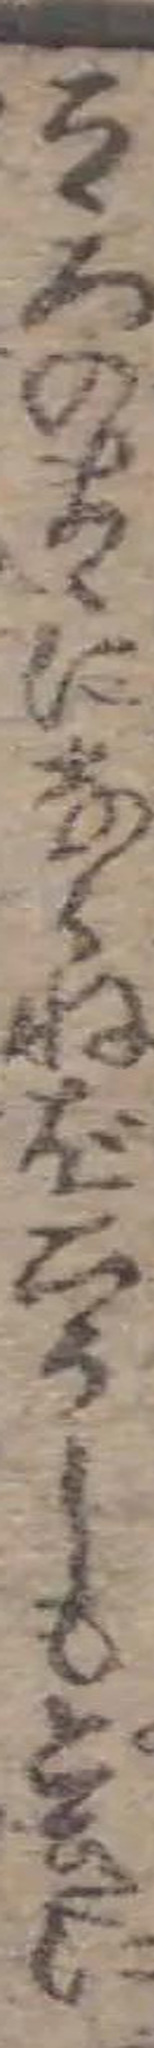こゝろのまゝにならねばこうしもときに
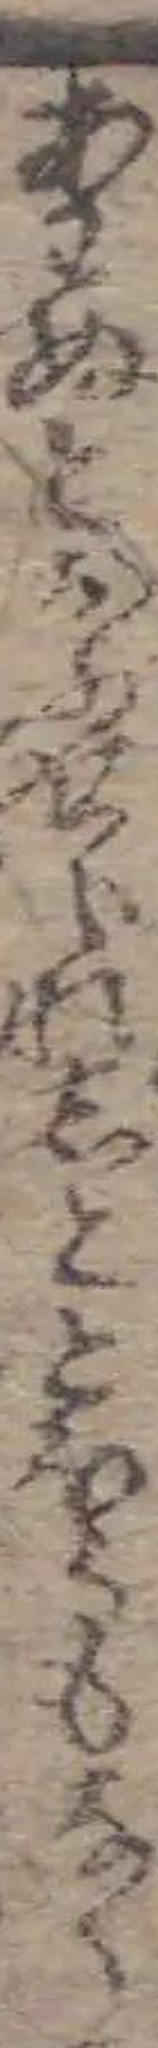あわぬとおふせられしととほうもなく
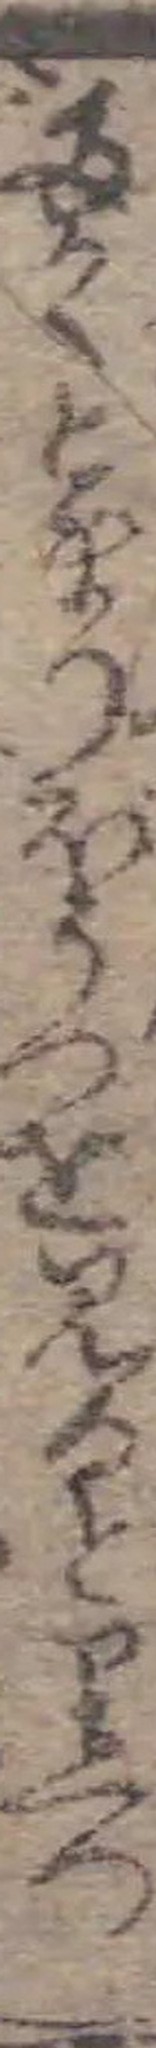たかくとまりほうつを見るとりくつ
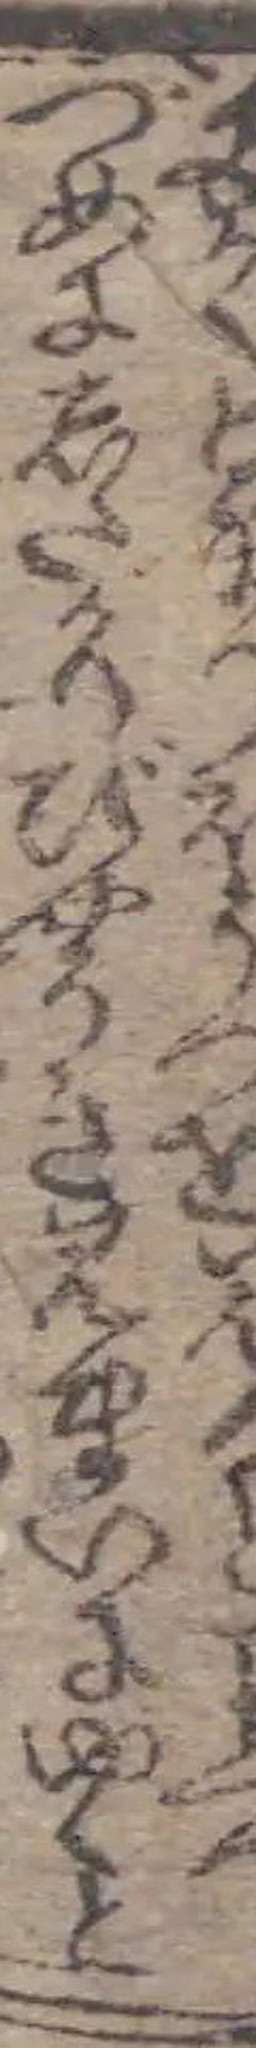づめにしたがりびやうき見まいにゆくと
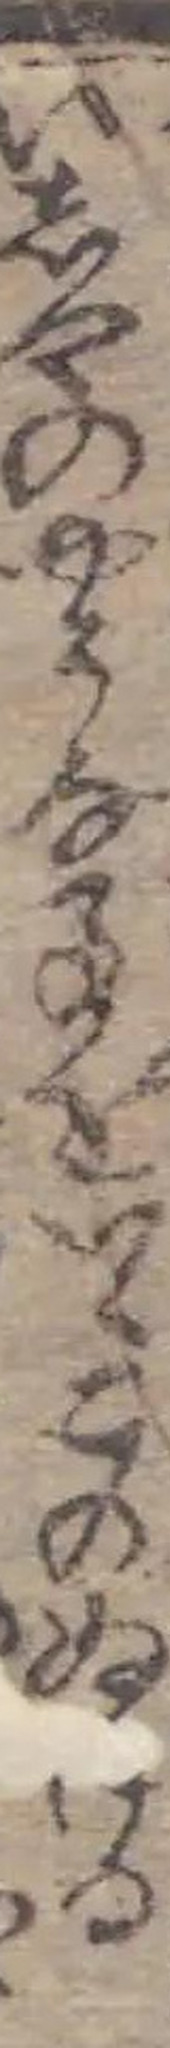いしやのやうな事をいゝこのぬける
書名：津以曽無弟の甚六 3巻
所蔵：国立国会図書館 National Diet Library, JAPAN
